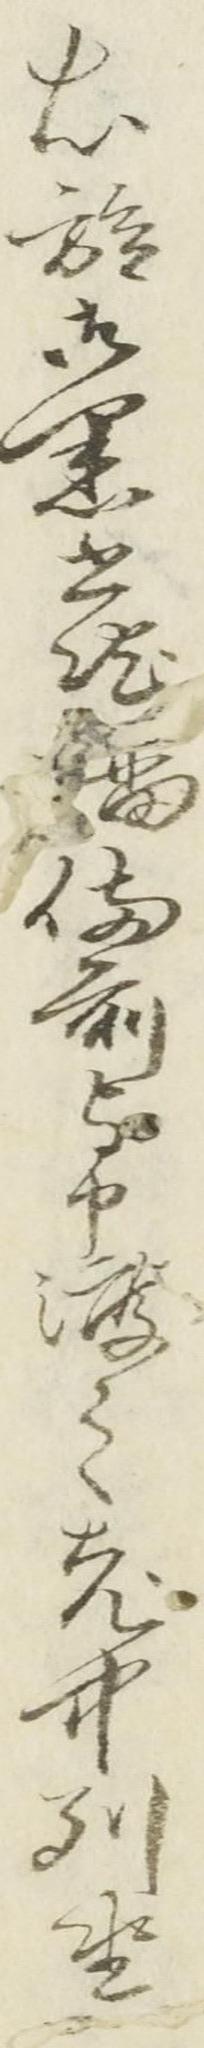右於御黒書院番備前守申渡之老中列坐
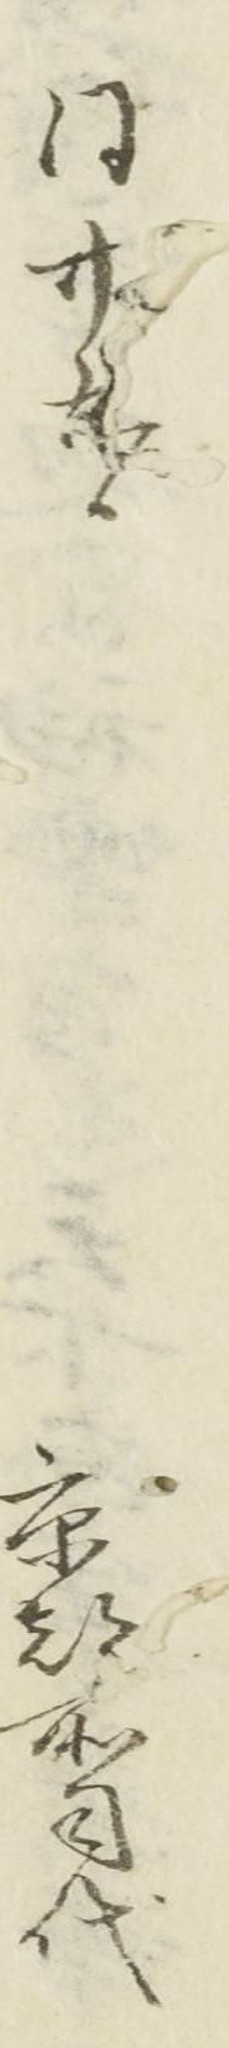同廿日京都所司代
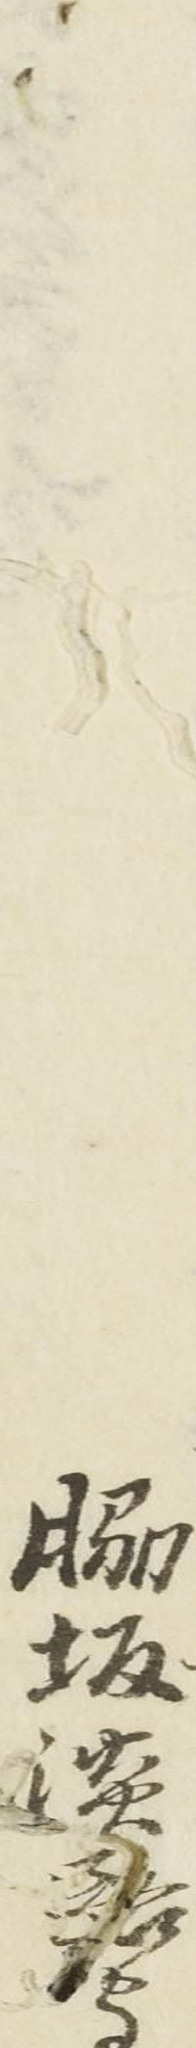脇坂淡路守
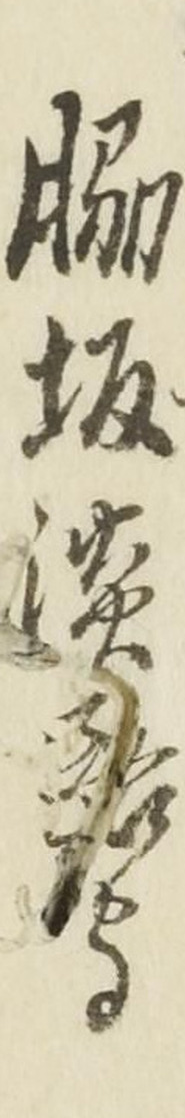脇坂淡路守
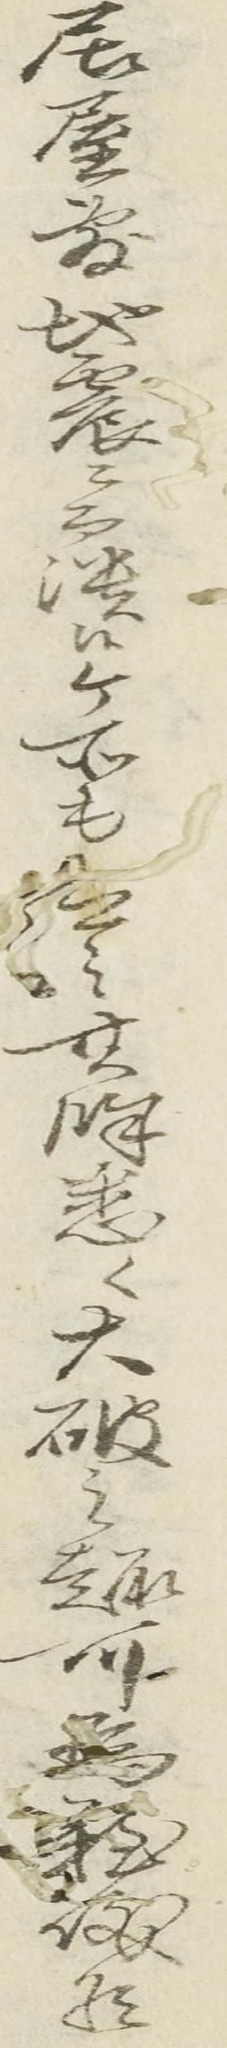居屋敷地震ニ而潰候ケ所も有之其餘悉く大破之趣可為難儀候
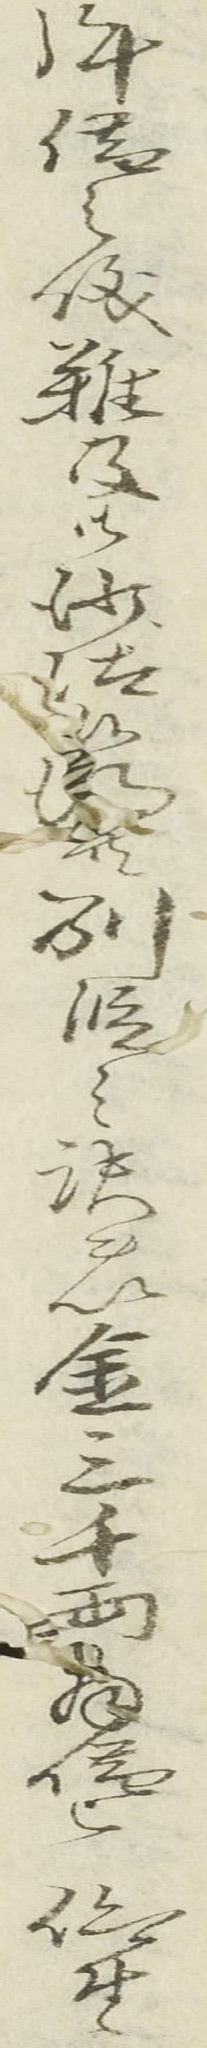拝借之儀難及御沙汰候得共別段之訳ヲ以金三千両拝借被仰付候
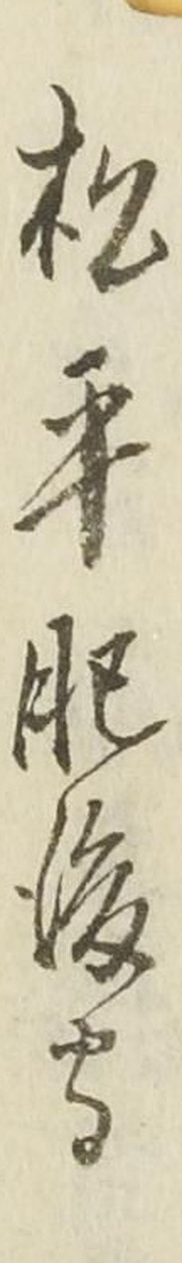松平肥後守
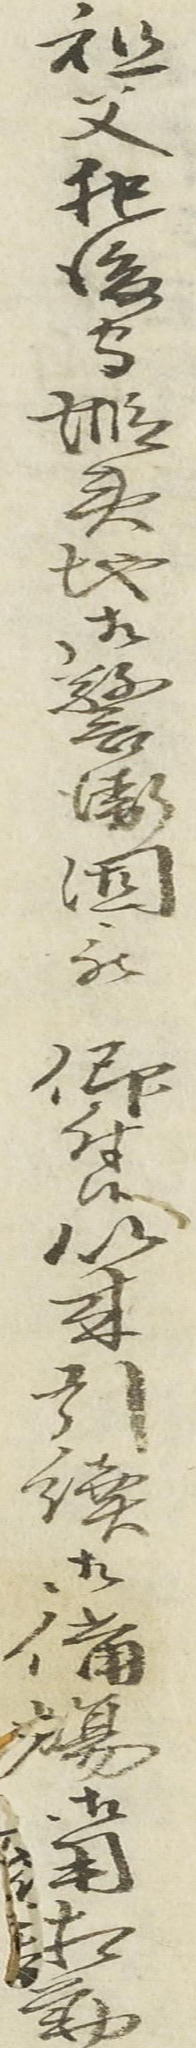祖父肥後守蝦夷地御警衛固被仰付候以来引続御備場御用相勤
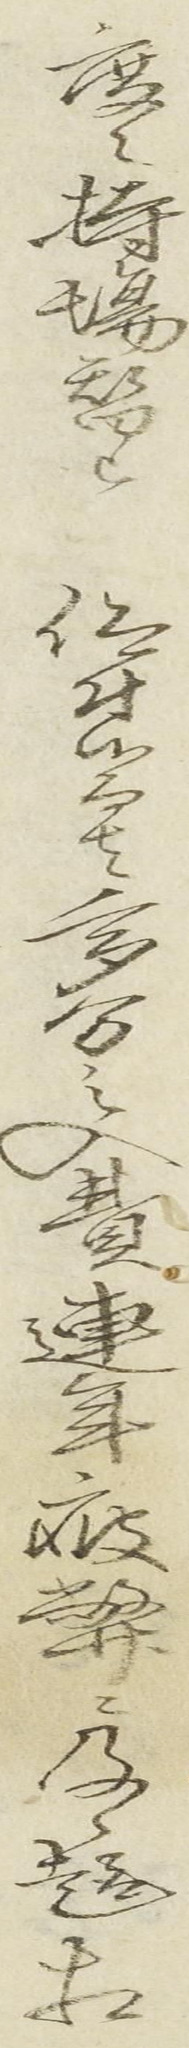度々持場替茂被仰付候而は多分之入費連年疲弊ニ及候趣相
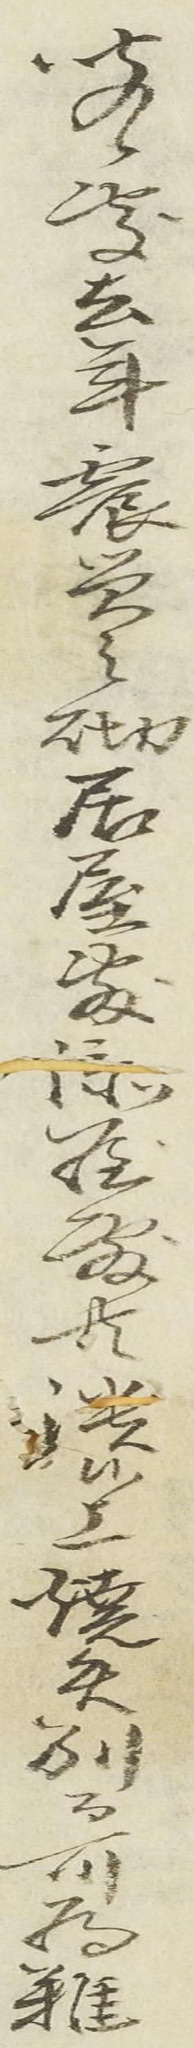聞候處去年震災之砌居屋敷添屋敷共潰候上焼失別而可為難
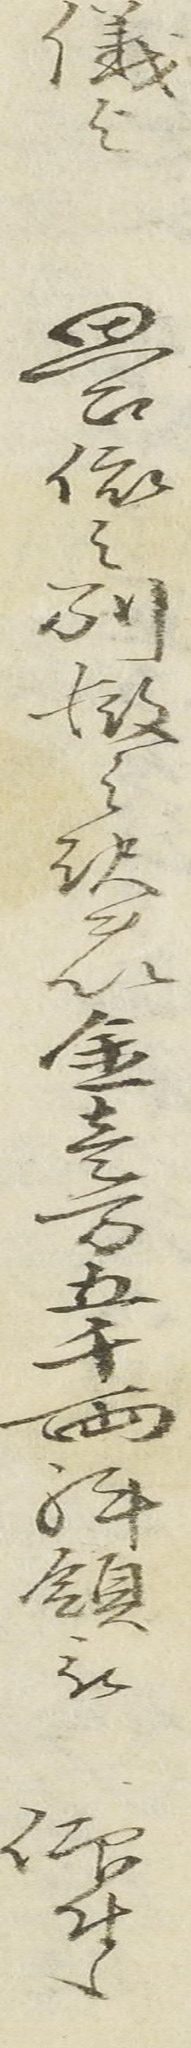儀と思召依之別段之訳ヲ以金壱万五千両拝領被仰付候
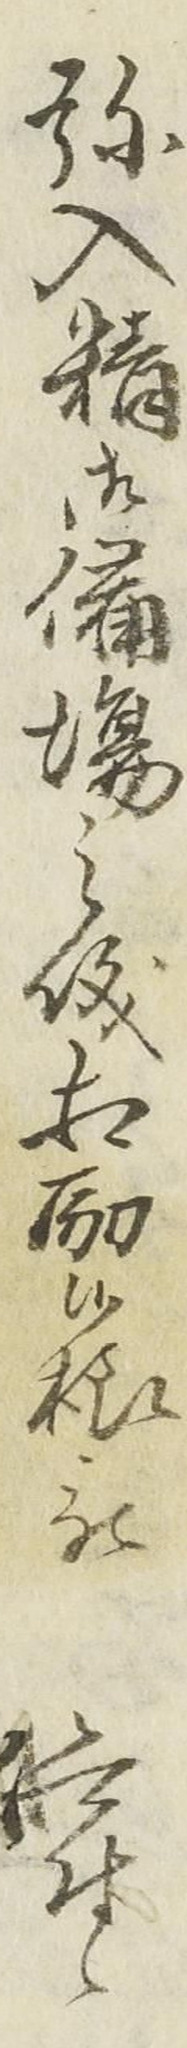弥入精御備場之儀相励候様被仰付候
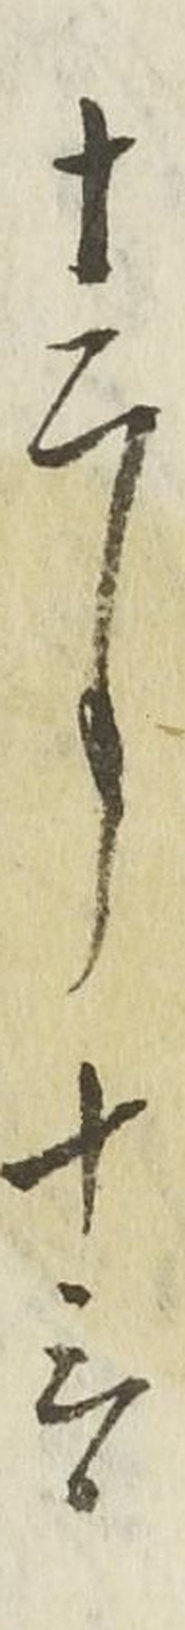十二月十三日
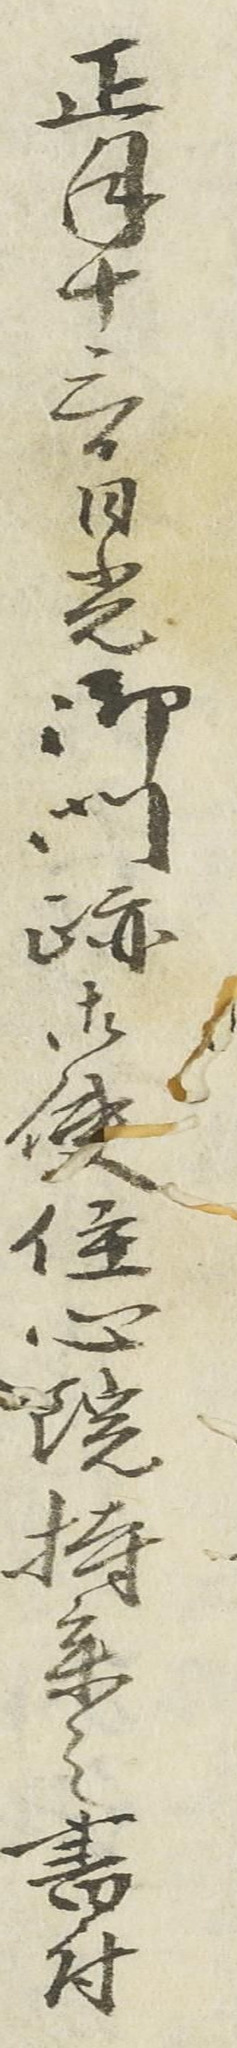正月十三日日光御門跡御使住心院持参之書付
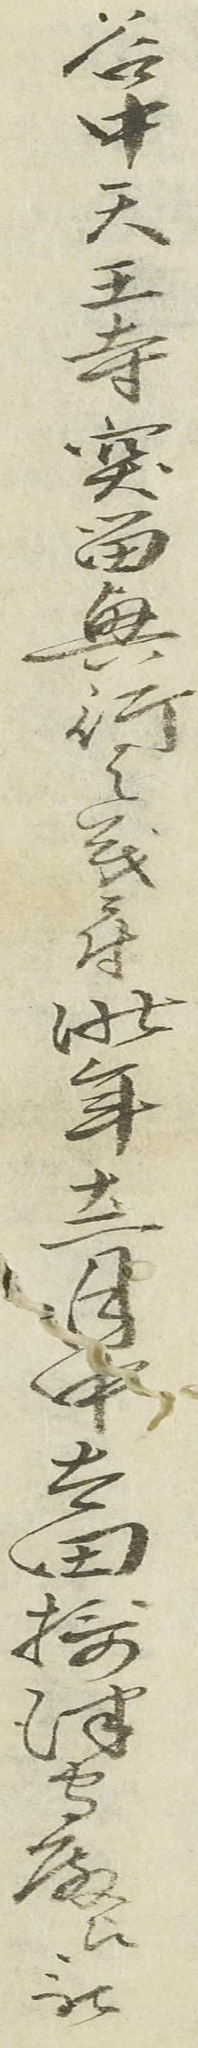谷中天王寺突留興行之義ニ付昨年十二月中太田摂津守殿え被

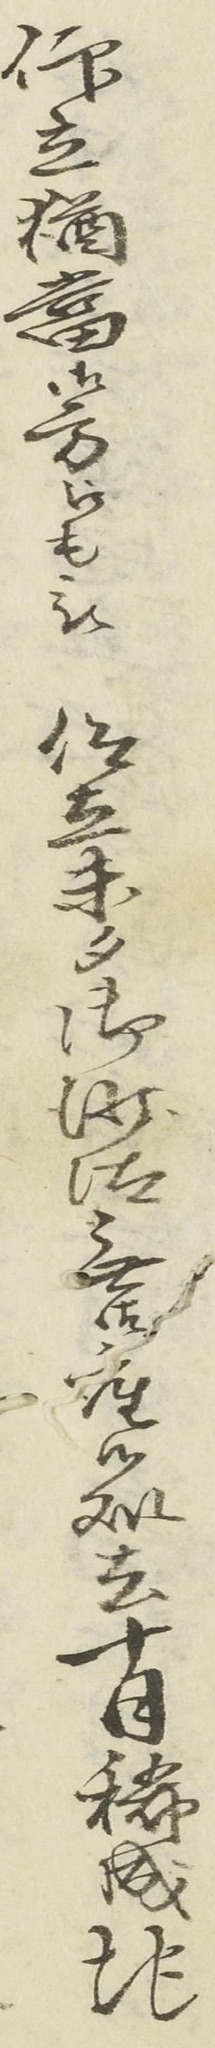仰立猶當御方えも被仰立未タ御沙汰無御座候処去十月稀成地
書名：安政二乙卯年十月二日大地震之事
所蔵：東京大学地震研究所図書室 Earthquake Research Institute Library, The University of Tokyo, JAPAN
